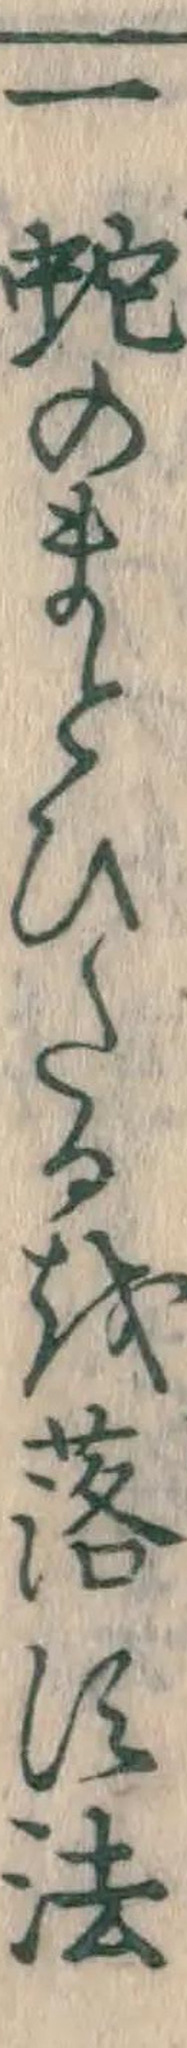一蛇のまとひたるを落す法
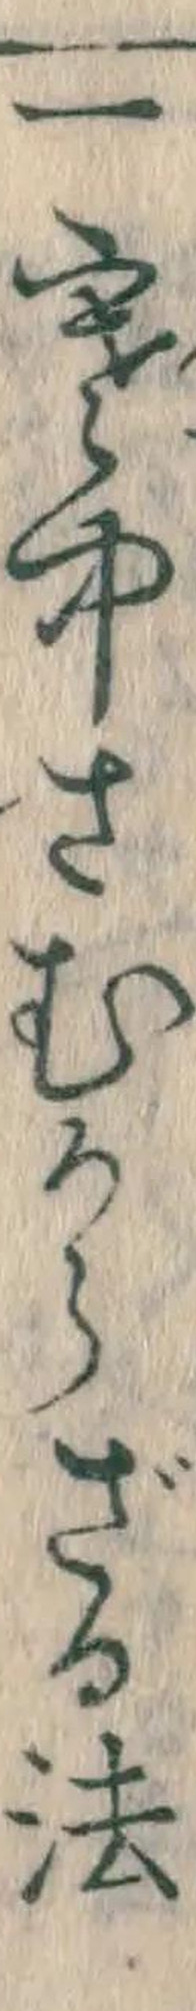一寒中さむからざる法
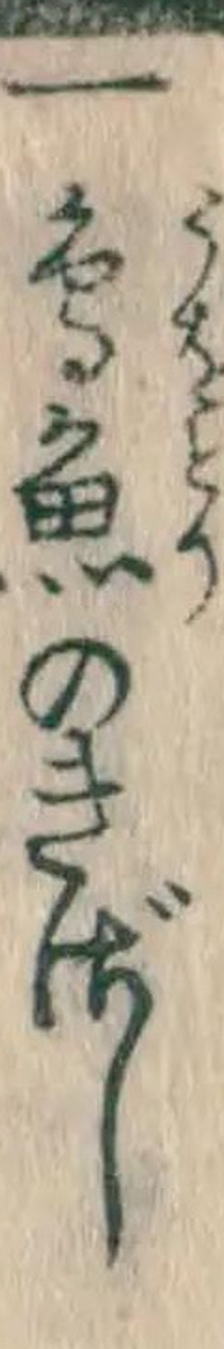一鳥魚のきざし
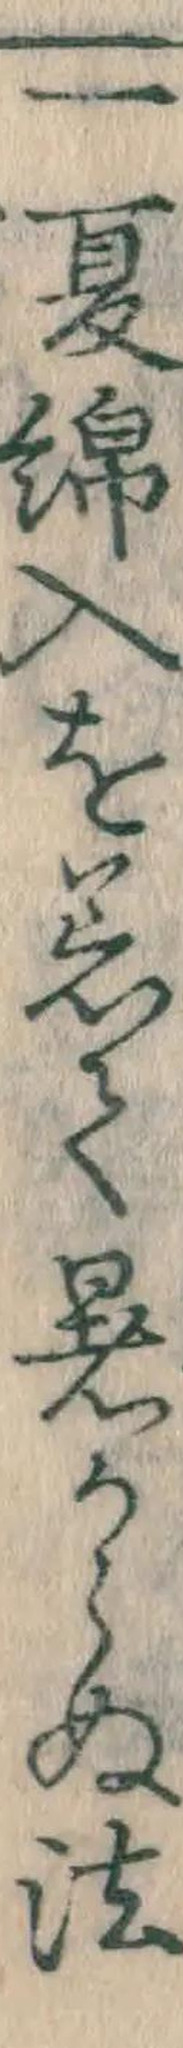一夏綿入を着て暑からぬ法
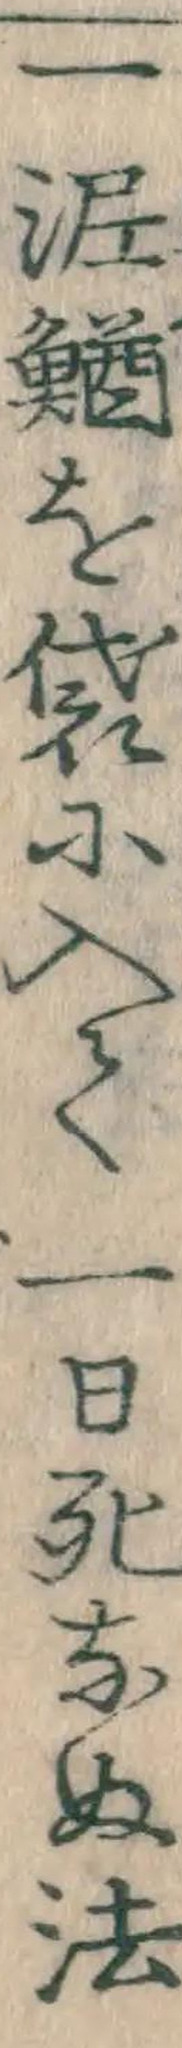一泥鰌を袋に入て一日死なぬ法

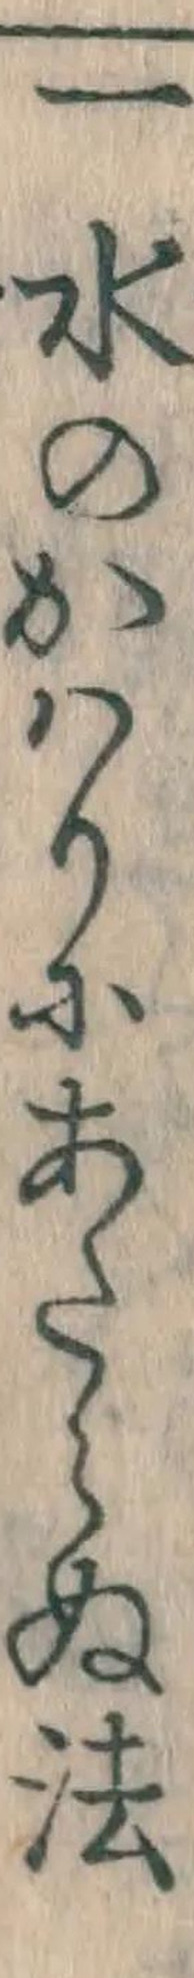一水のかはりにあたらぬ法
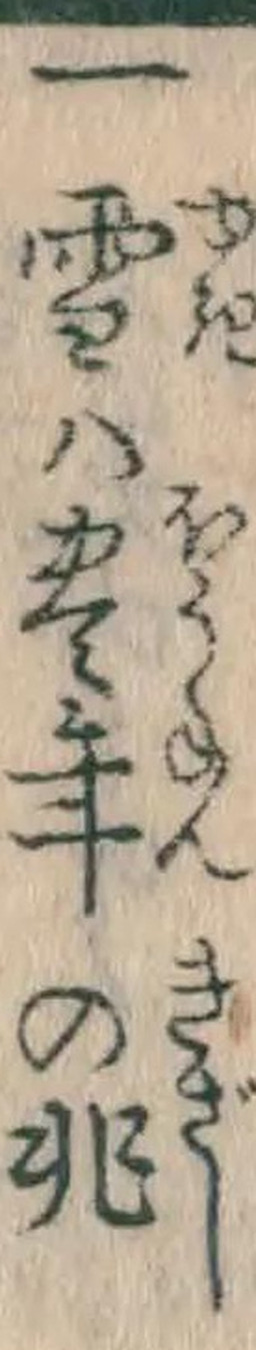一雪は豊年の兆
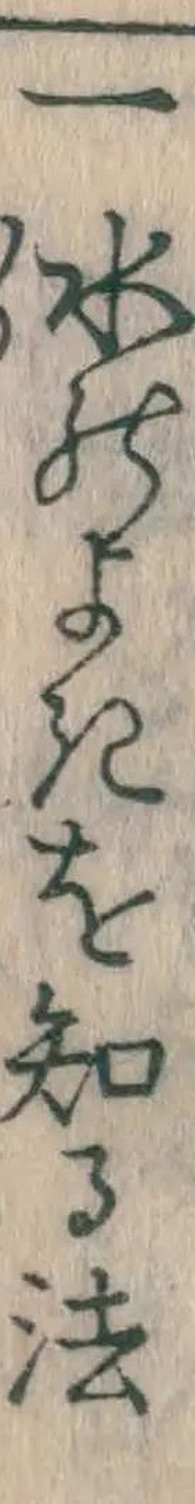一水のよきを知る法
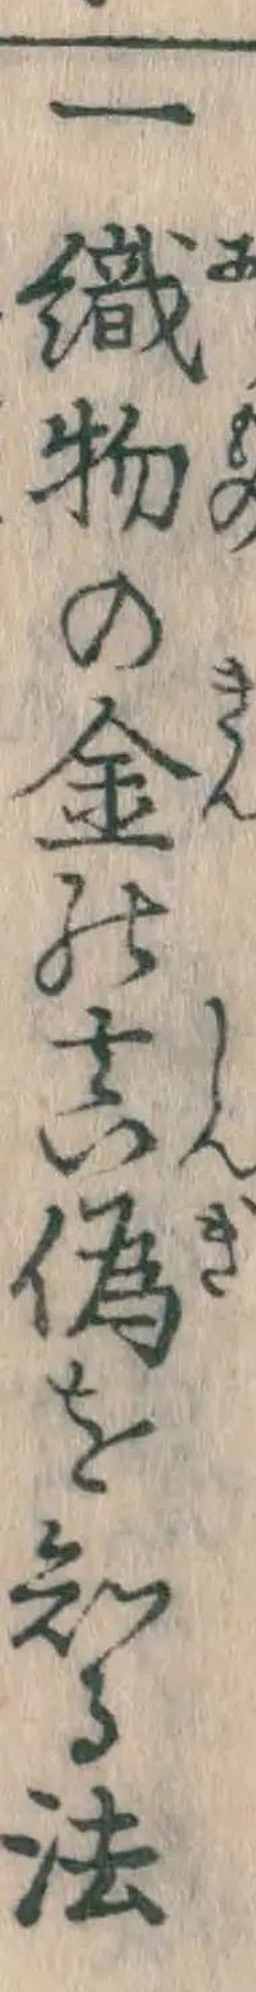一織物の金の真偽を知る法
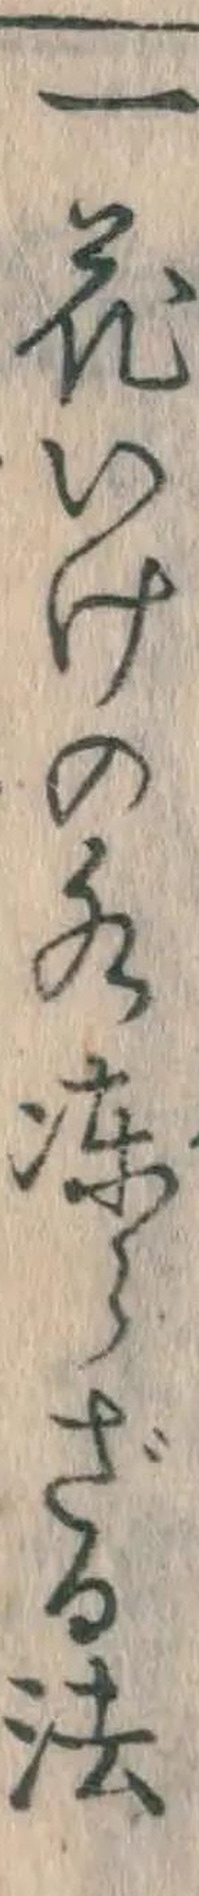一花いけの水凍らざる法
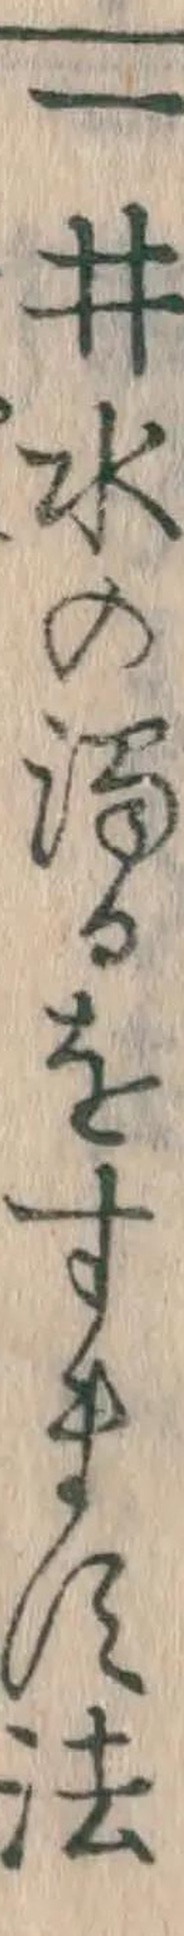一井水の濁るをすます法
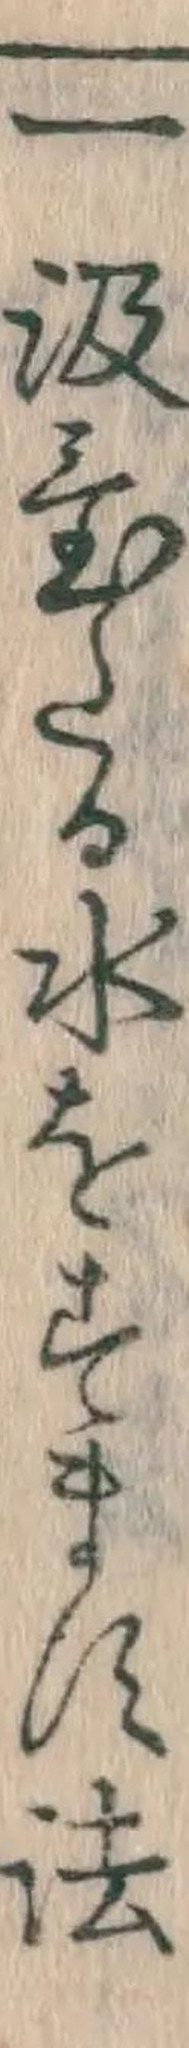一汲置たる水をすます法
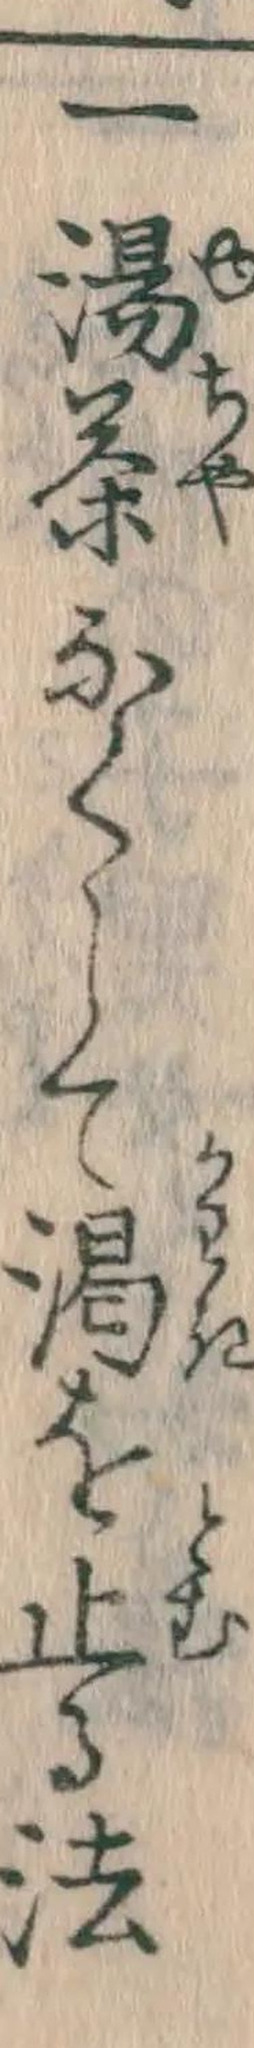一湯茶なくして渇を止る法
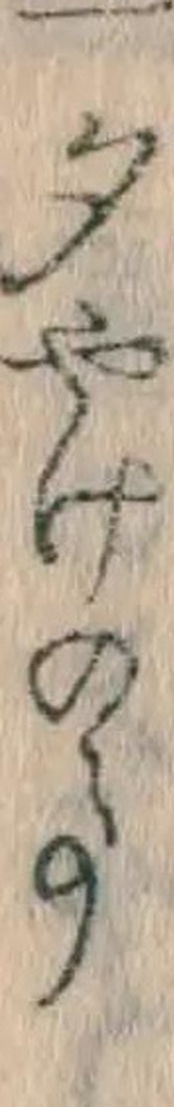一夕やけの事
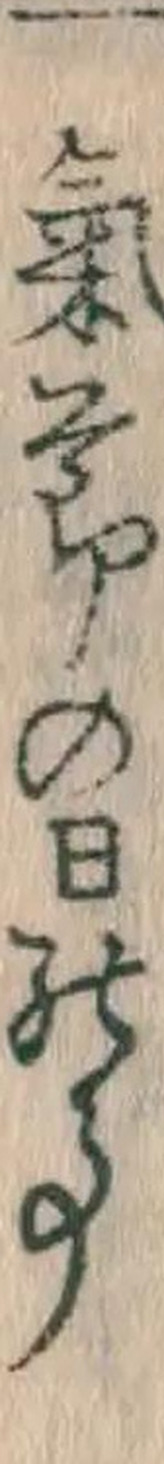一気節の日の事
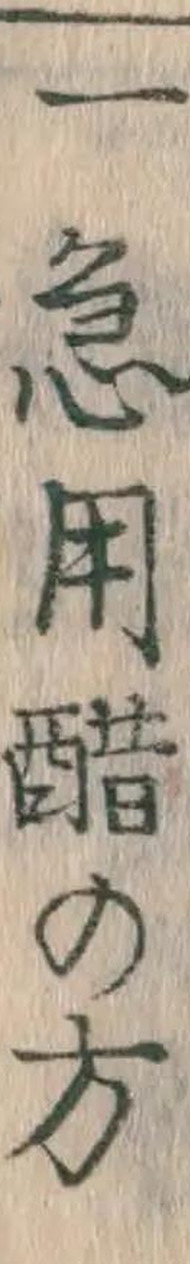一急用醋の方
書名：広益秘事大全 3巻. [1]
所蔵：国立国会図書館 National Diet Library, JAPAN
